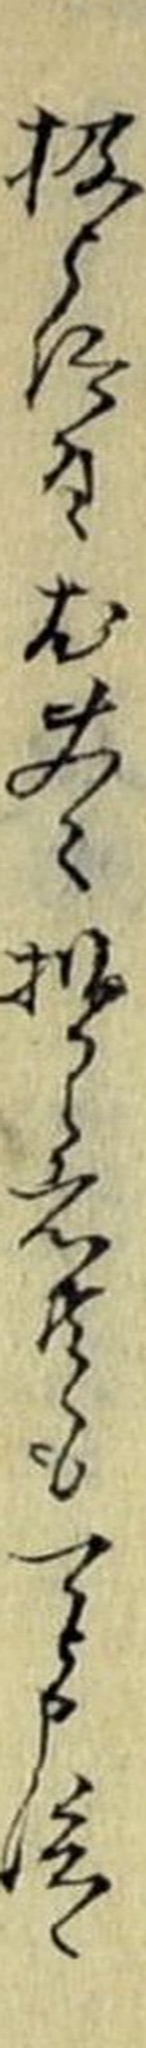扱被仰付候尤夫々掛り之者共へも可被申渡候
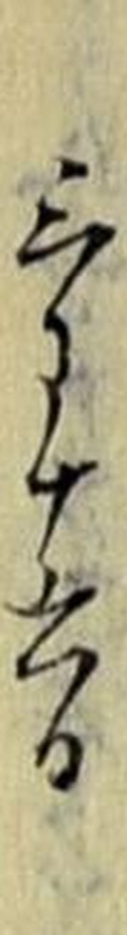三月十六日
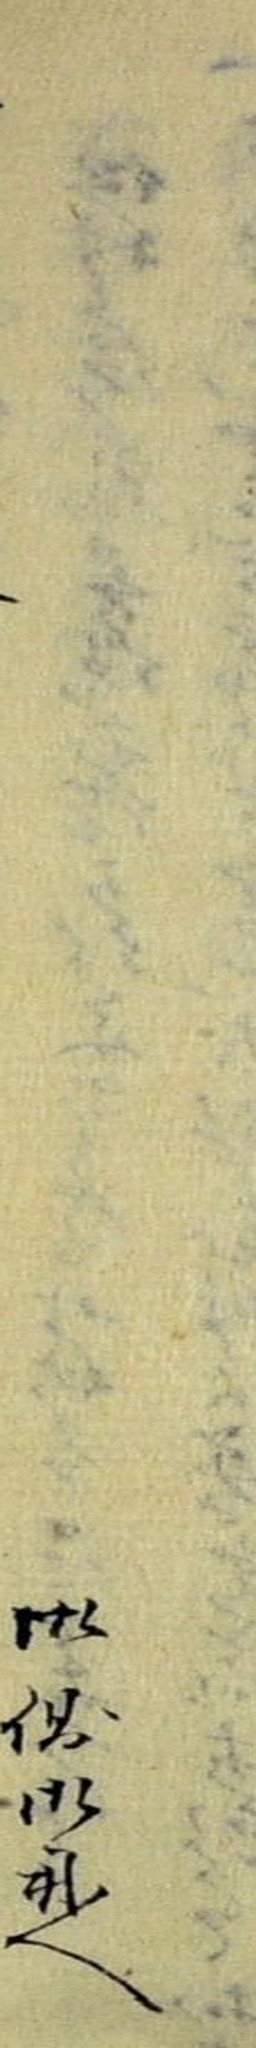御側御用人
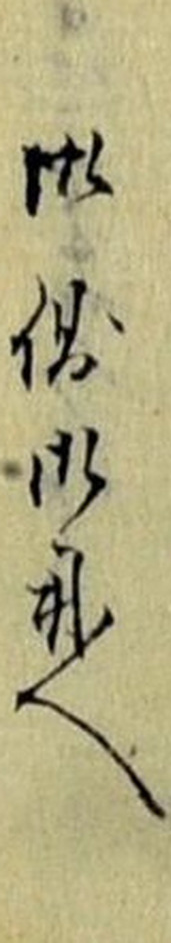御側御用人
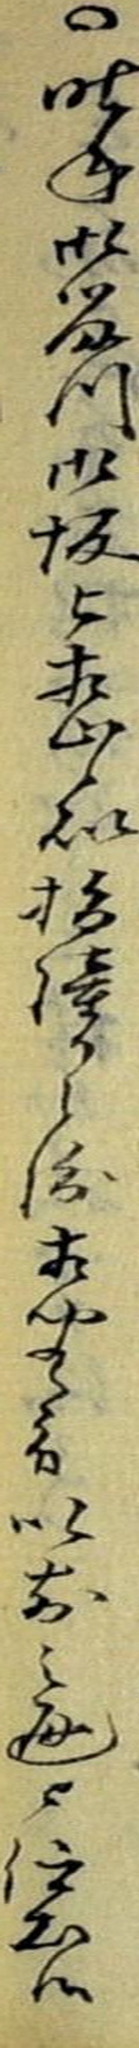○昨年御留川御扱被相止候処指障之儀相聞候に付以前之通被仰出候
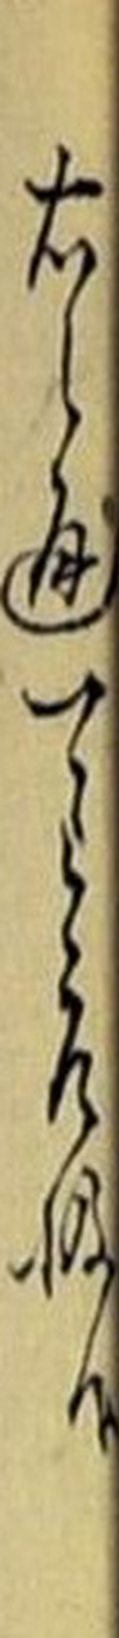右之通可被取扱候
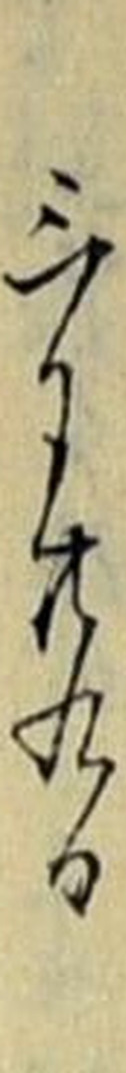三月廿九日
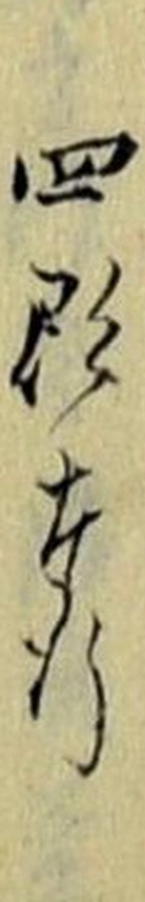四郡奉行
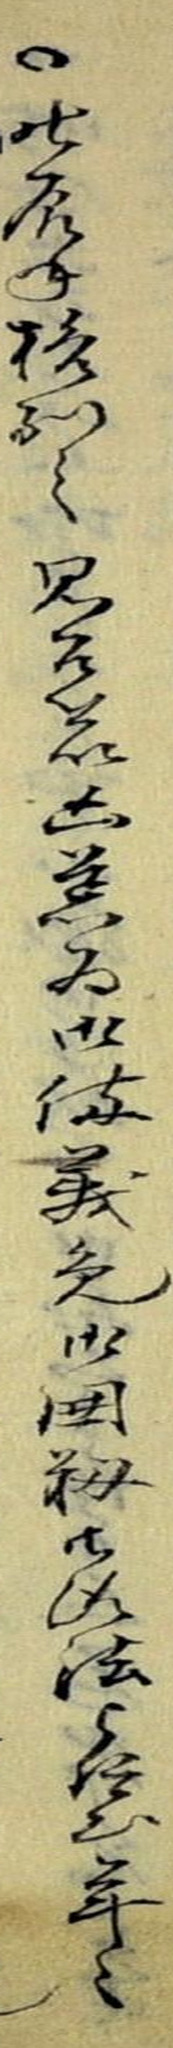○昨辰年格別之思召を以凶荒為御備義免御囲籾御趣法被仰出年々
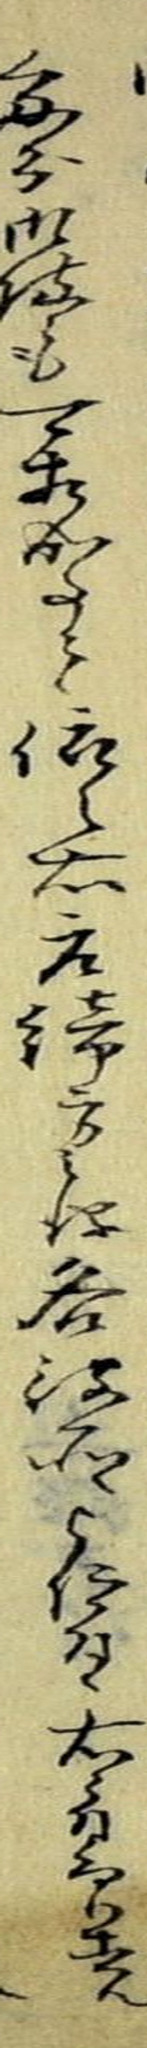多分御備にも可相成事に候依之右取締方之儀各役所へ被仰付候右に付而は去ル
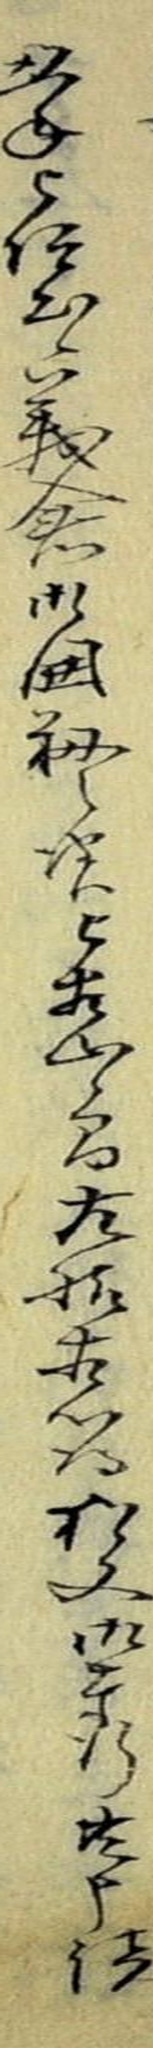丑年被仰出候義倉御囲籾之義は被相止候間左様相心得猶又御奉行共申談
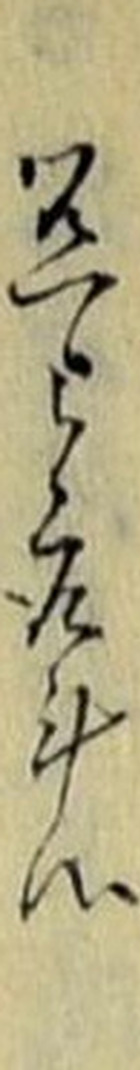宜被取斗候
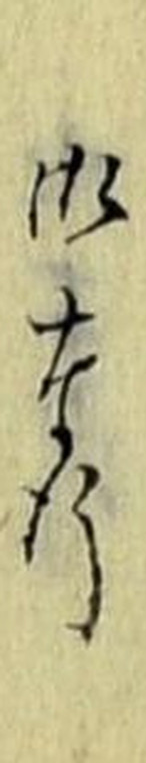御奉行
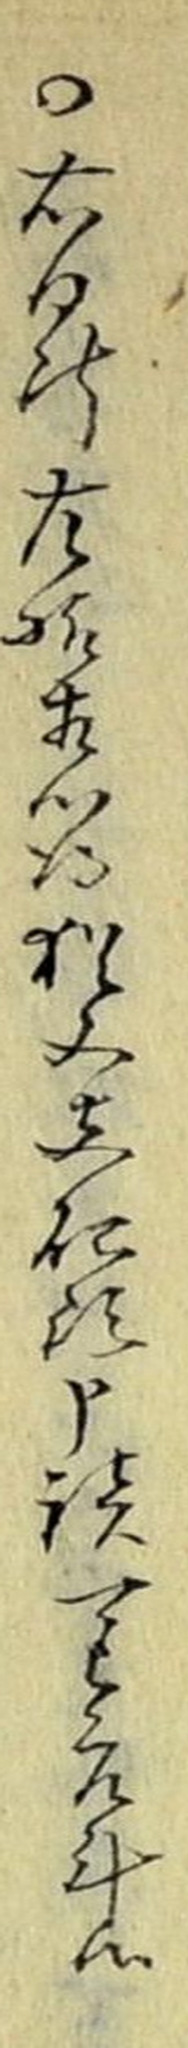○右同断左様相心得猶又支配頭申談可被取斗候
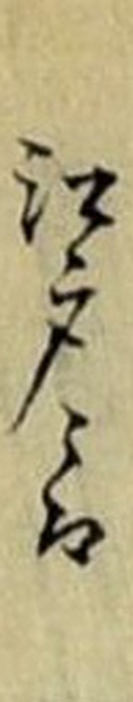江戸に而
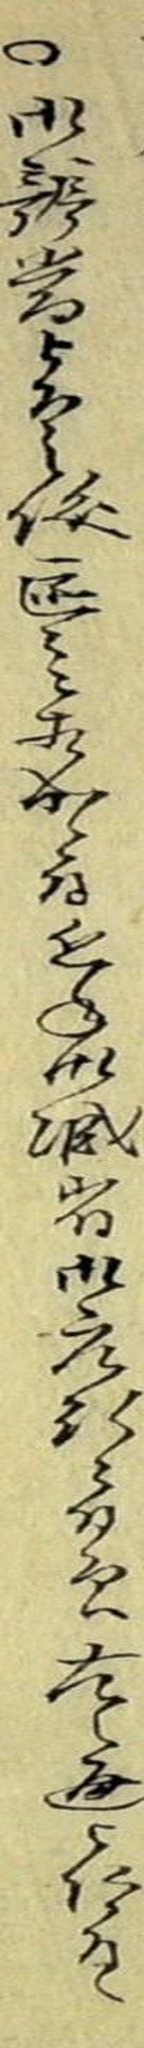○御弁当被下之儀區々に相成候に付近年御減省御取行に付而は左之通被仰付候
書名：命令之部 六
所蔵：福井県文書館 Fukui Prefectural Archives
